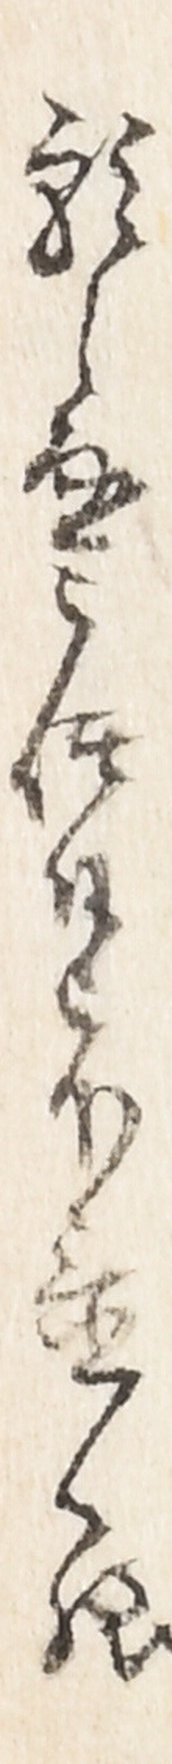願之通被仰付被下置候様

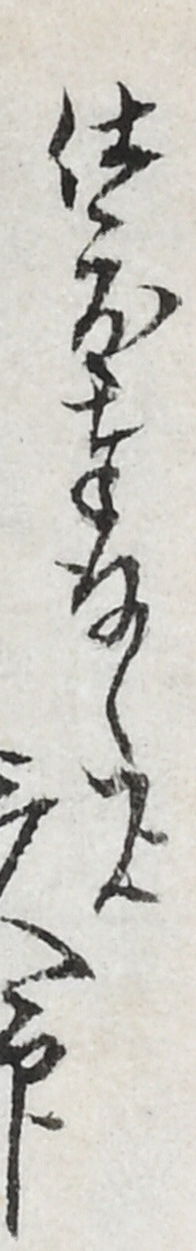仕度奉存候以上
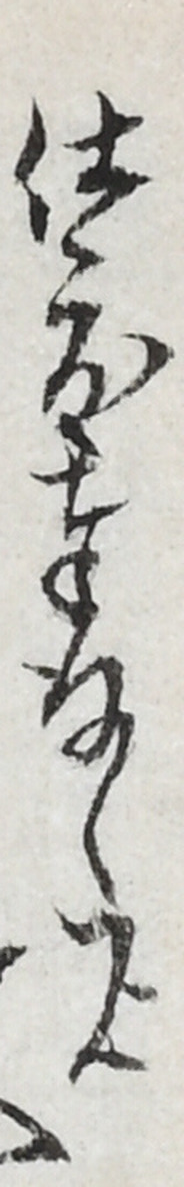仕度奉存候以上
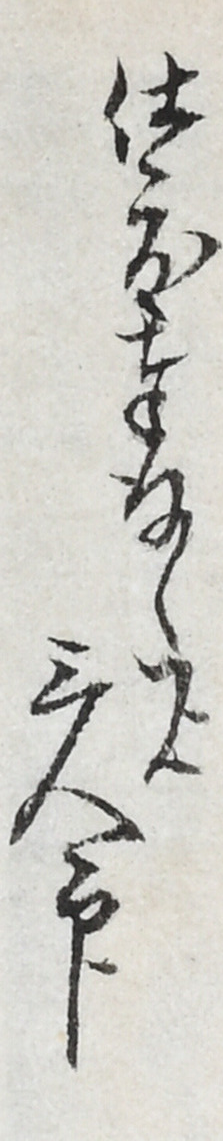仕度奉存候以上
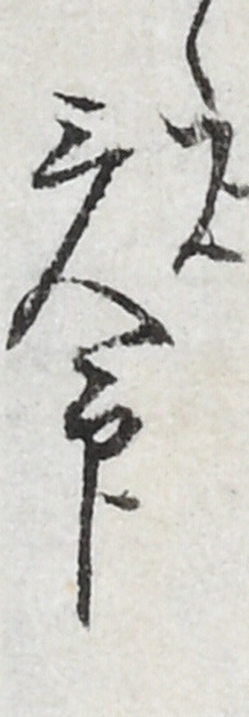三人印
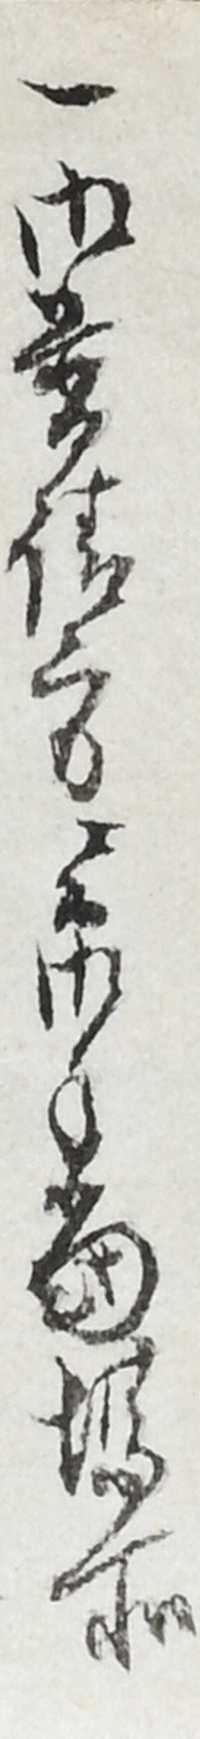一御普請方ニ而御手当場所
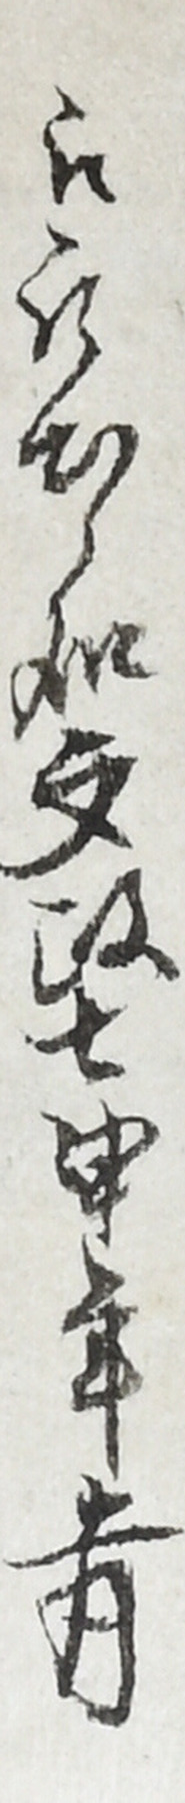被罷出候処文政七申年肴
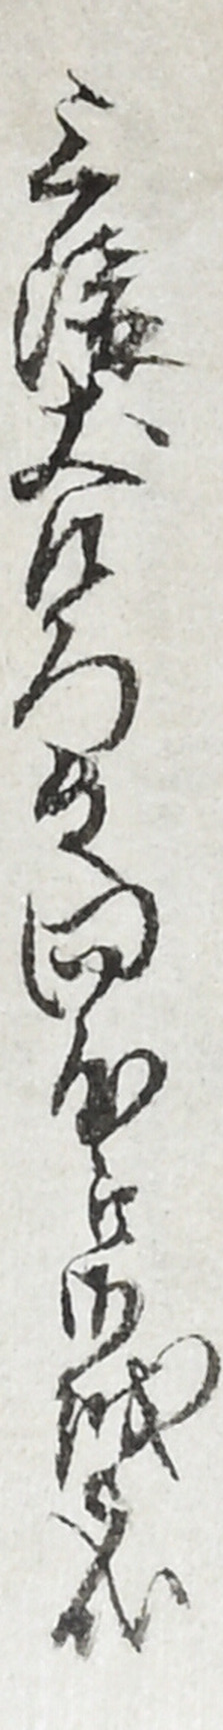三溝丈左衛門殿問屋江御越被成
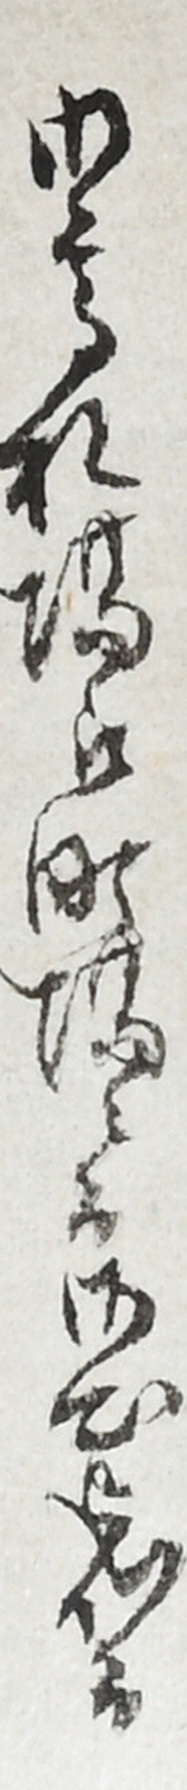御高札場江町場ニ而御出被成旨
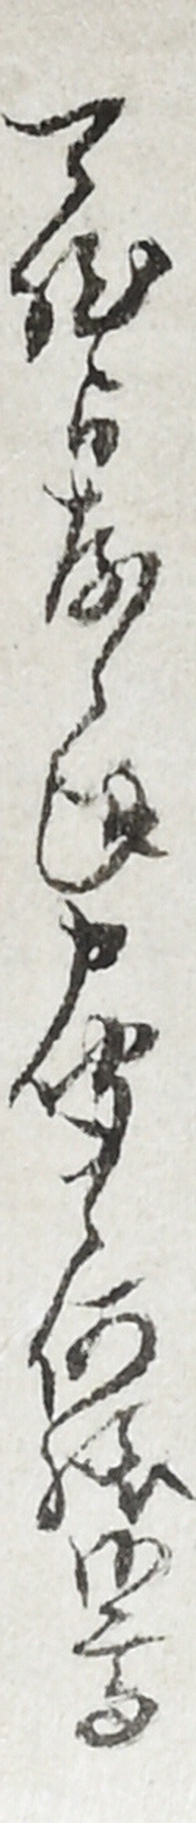可然と存候趣申聞候何様御高
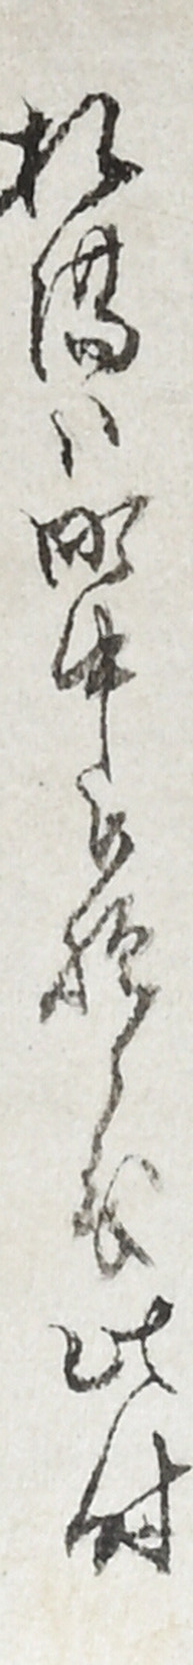札場ハ町中被遊候義此時
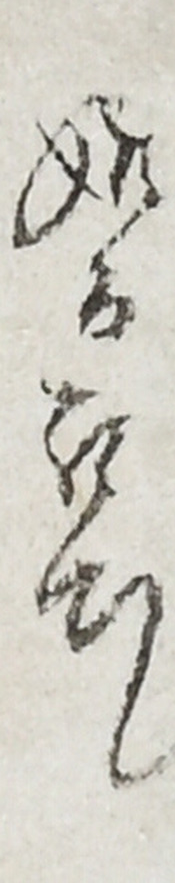始而罷出候
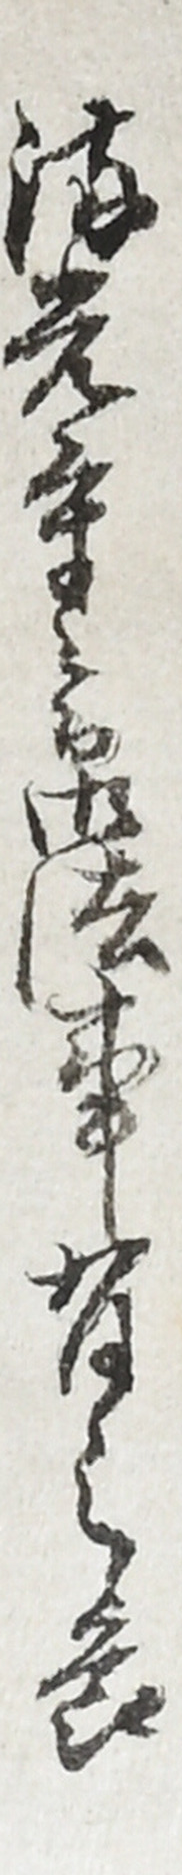満光寺ニ而御法事有之節
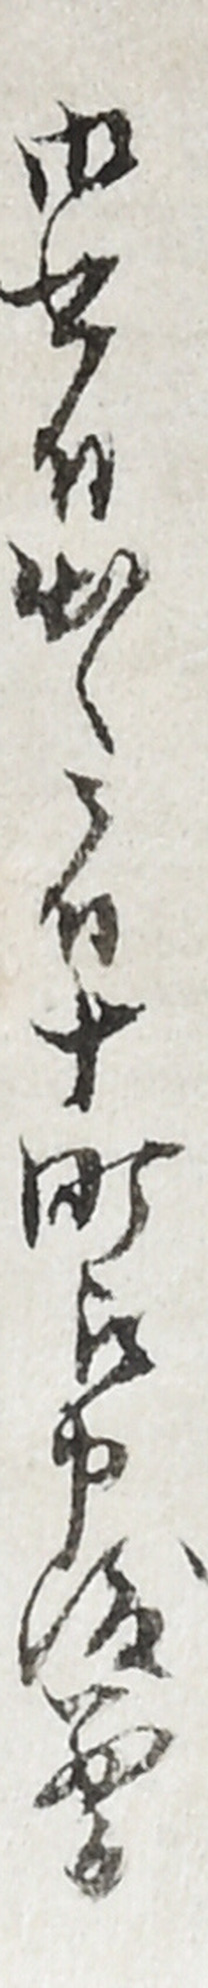御書付出候ニ付十町江申渡兼る
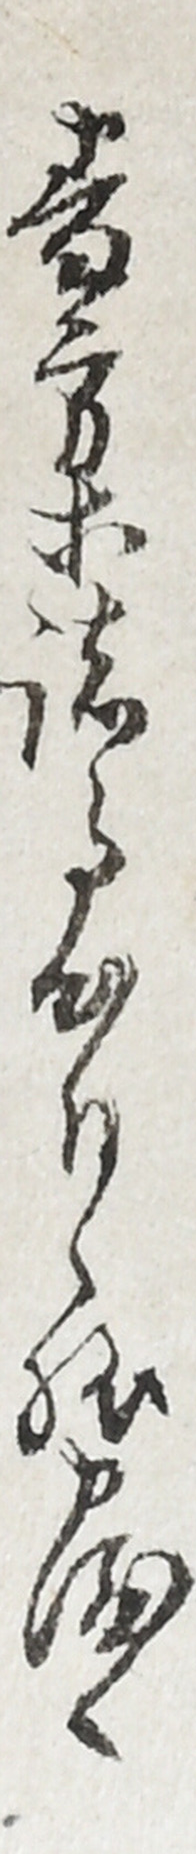番方等諸事心付候様申渡候
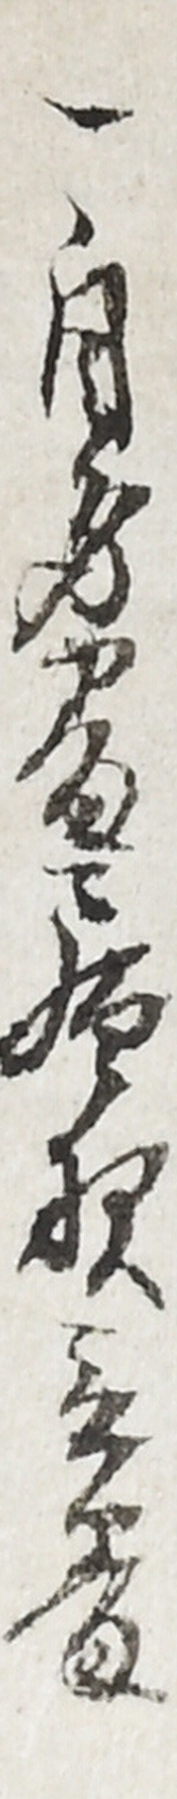一自身番昼夜壱番
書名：年内行事懐中録
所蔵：伊那市立高遠町図書館・合同会社AMANE
